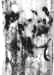朝
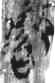啟
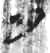夕
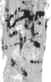閟（閉）
